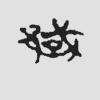國
